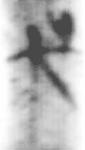吳
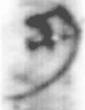甲
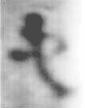屯
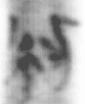紫
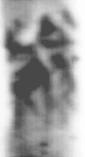○（縢）
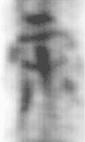兩
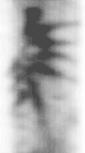馬
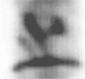之
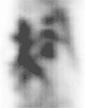厀（漆）
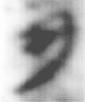甲
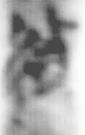紫
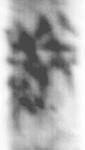縢
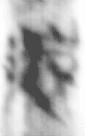無
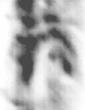兩
